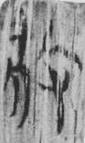○（尋）
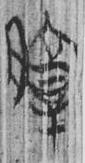○（墻）
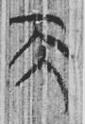而
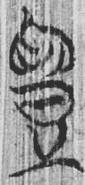豊
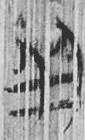并（屏）
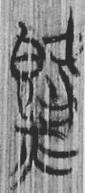○（氣）
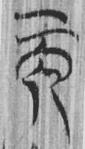而
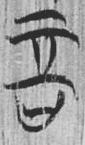言
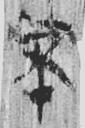不
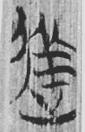○（失）
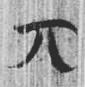亓（其）
